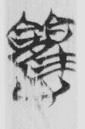{雚心}
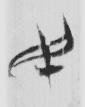民
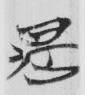是
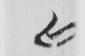㠯（以）
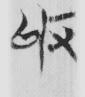收
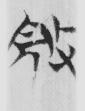{宀丏攴}
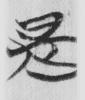是
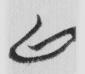㠯（以）
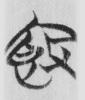{勹㿝攴}
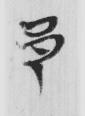邑
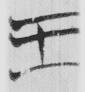王
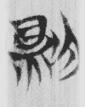則
